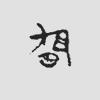旬
